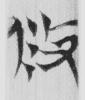攸
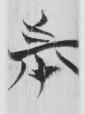市
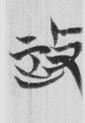政
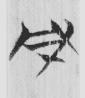凡
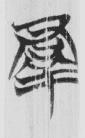羣
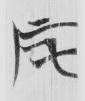厇
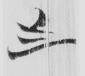之
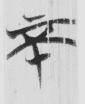不
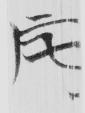厇
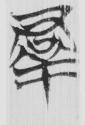羣
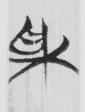采
